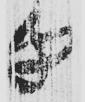臣
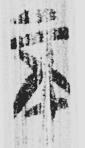不
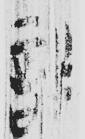訐（諫）
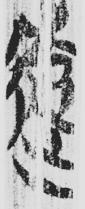遠
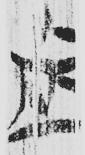者
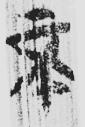不
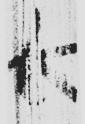方
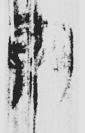則
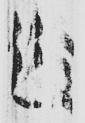攸（修）
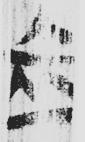者
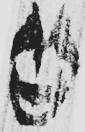向（鄉）
